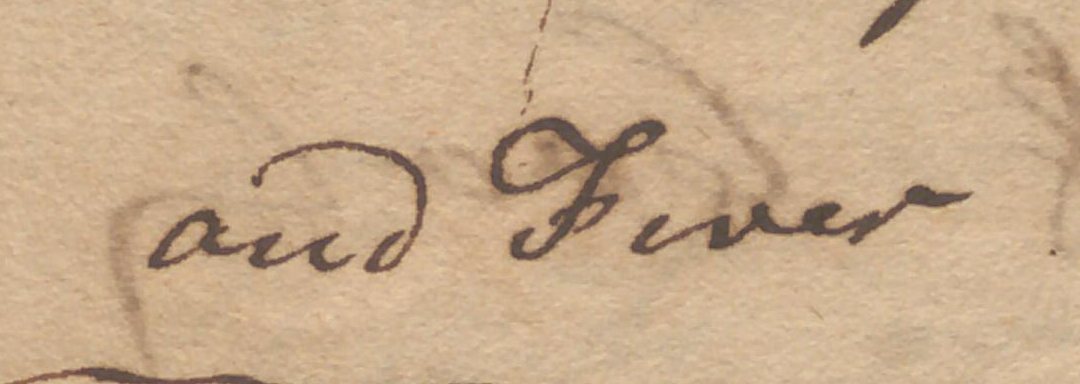and Fever
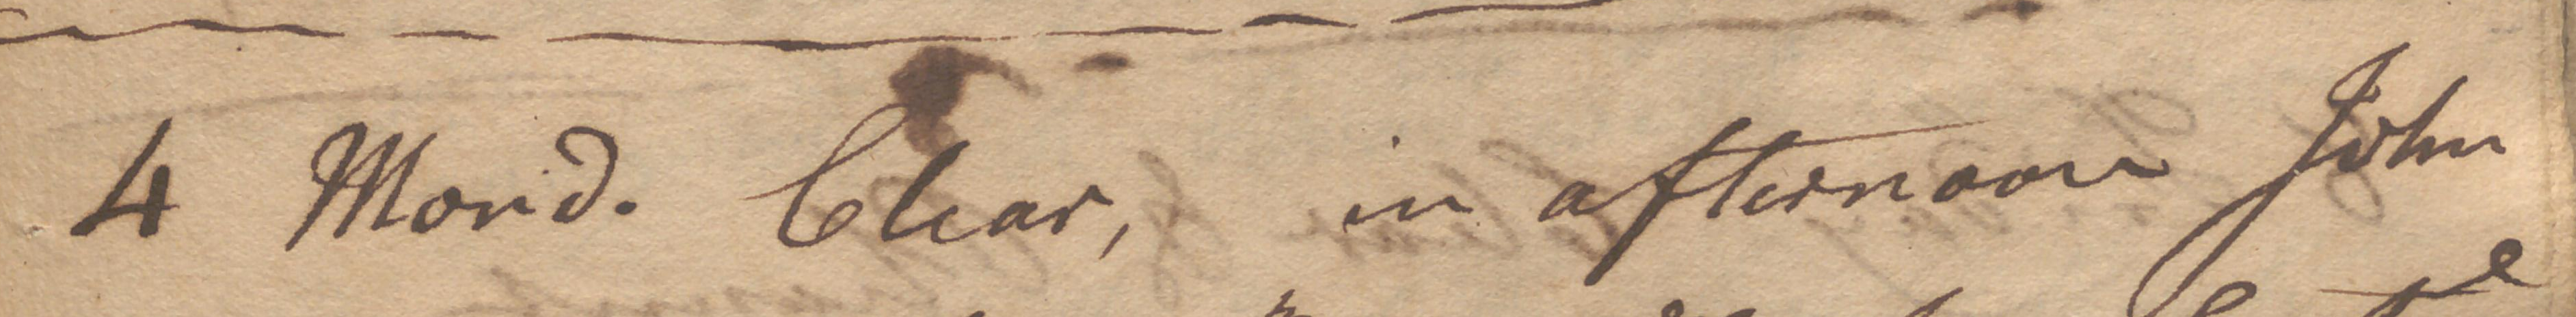4 Mond. Clear, in afternoon John
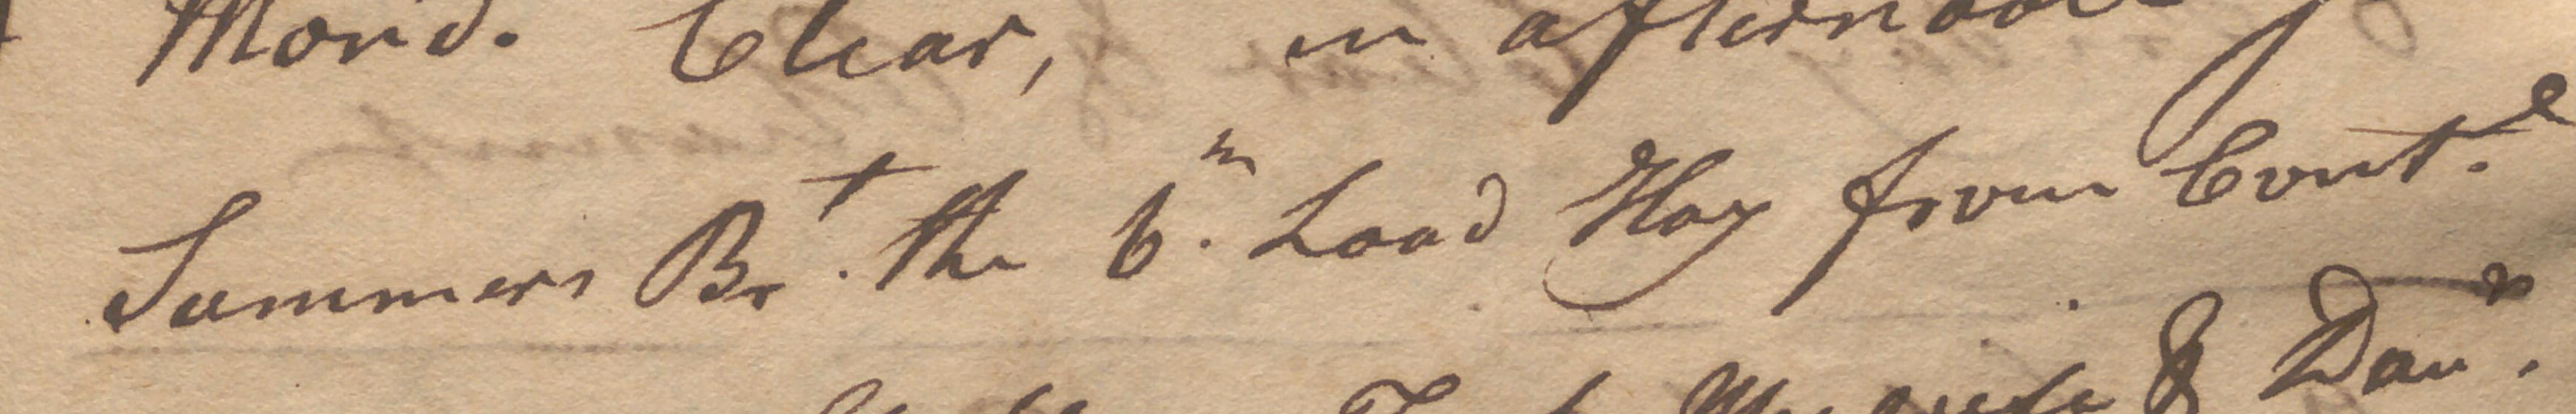Summers Br^t. the 6^th. Load Hay from Cont^l.
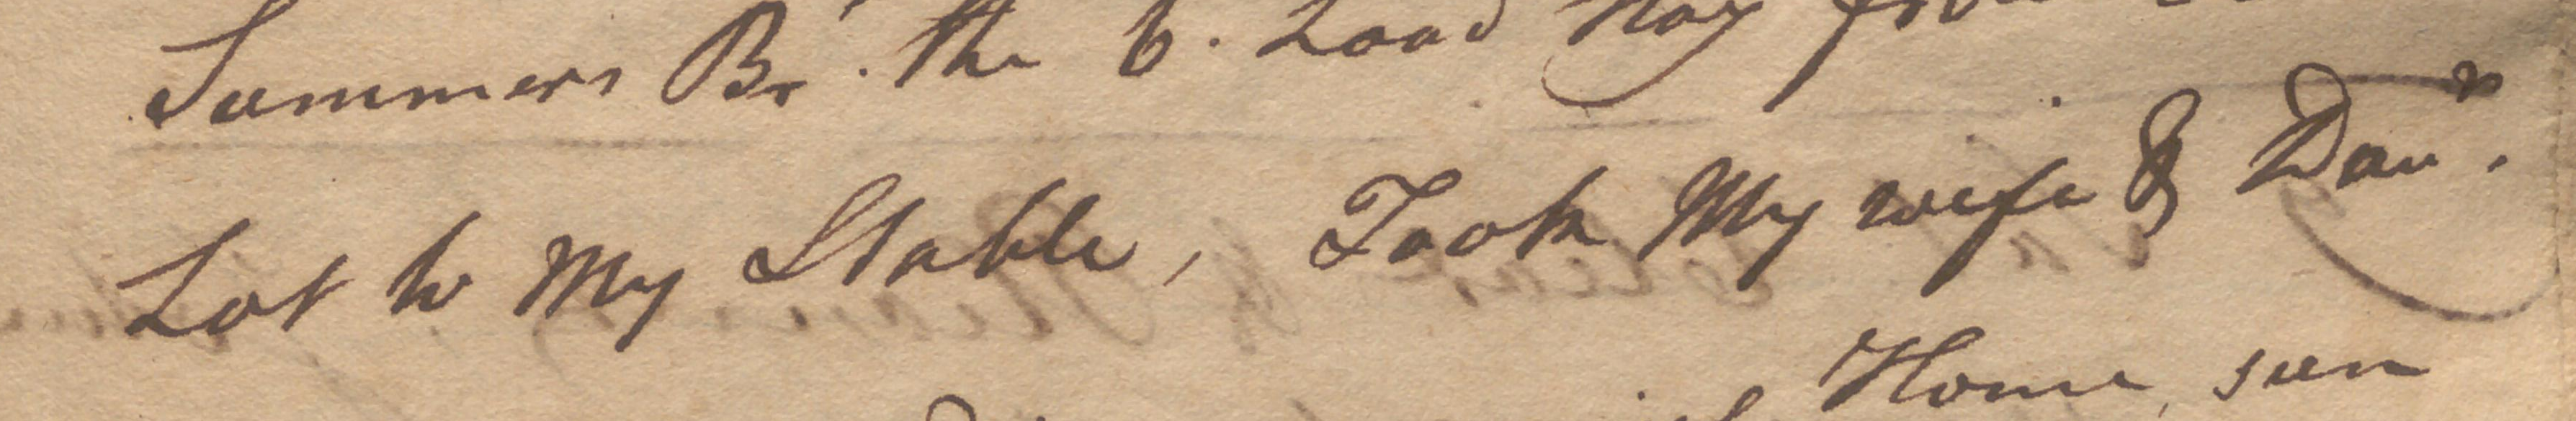Lot to My Stable, Took My wife & Dau^r.
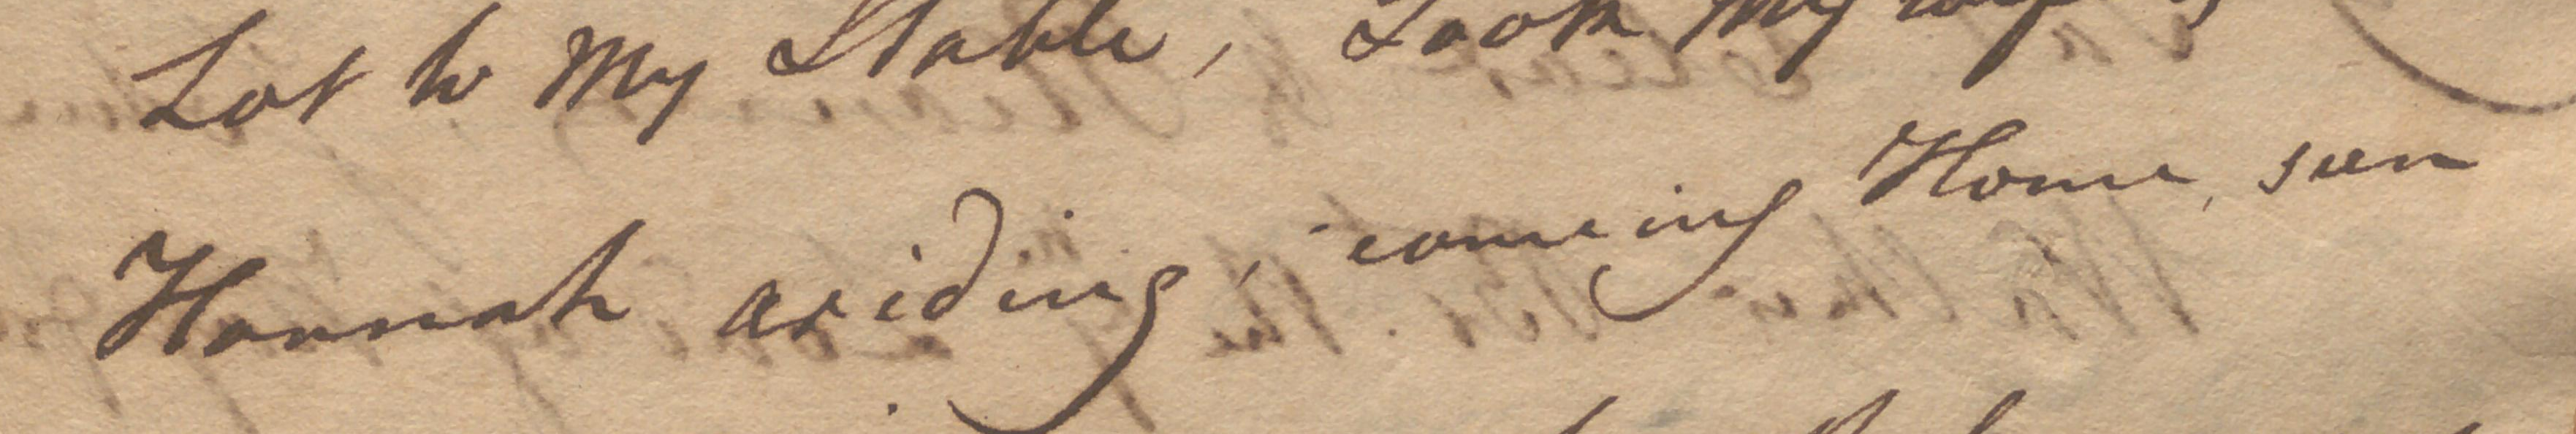Hannah a riding coming Home, seen
